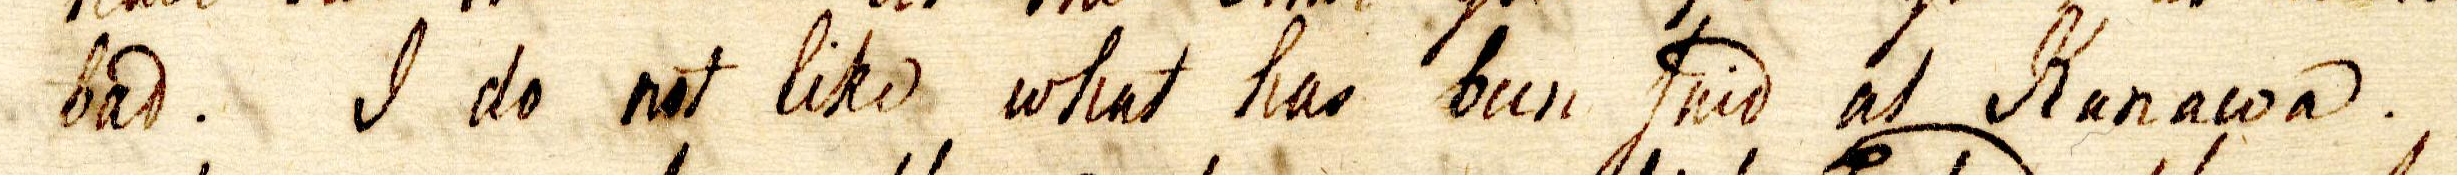bad. I do not like what has been said at Kanawa.
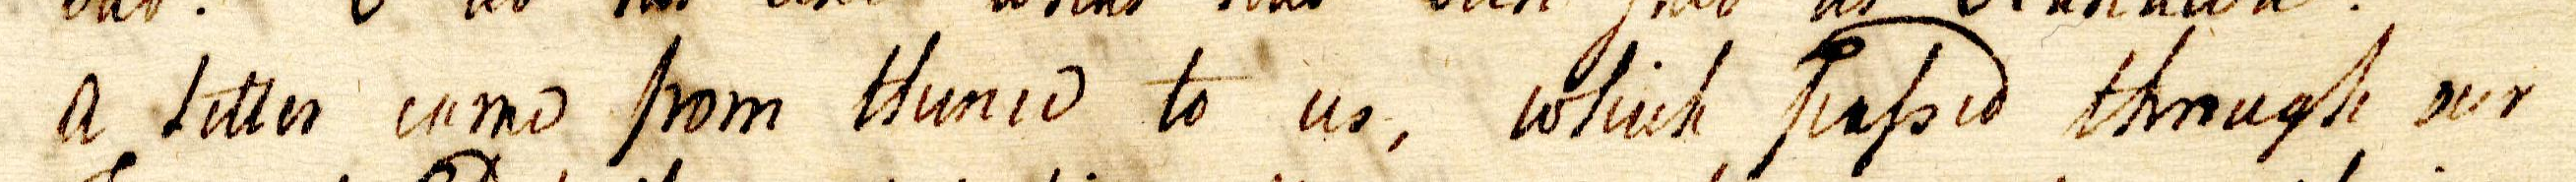A Letter came from thence to us, which passed through our
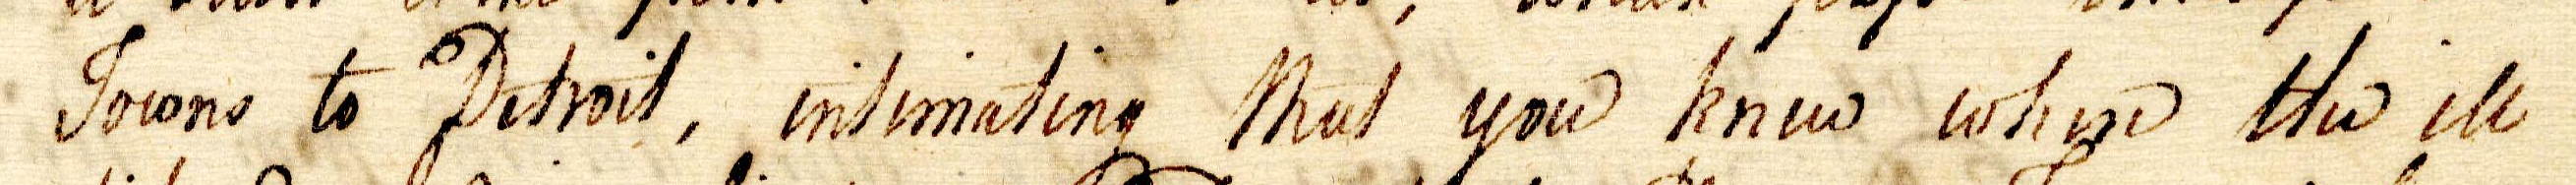Towns to Detroit, intimating that you knew where the ill
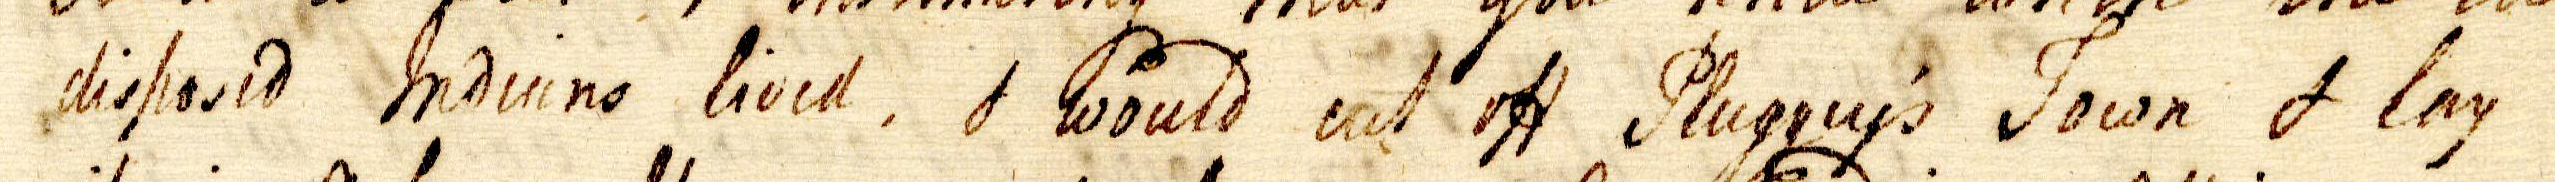disposed Indians lived, & would cut off Pluggey's Town & lay
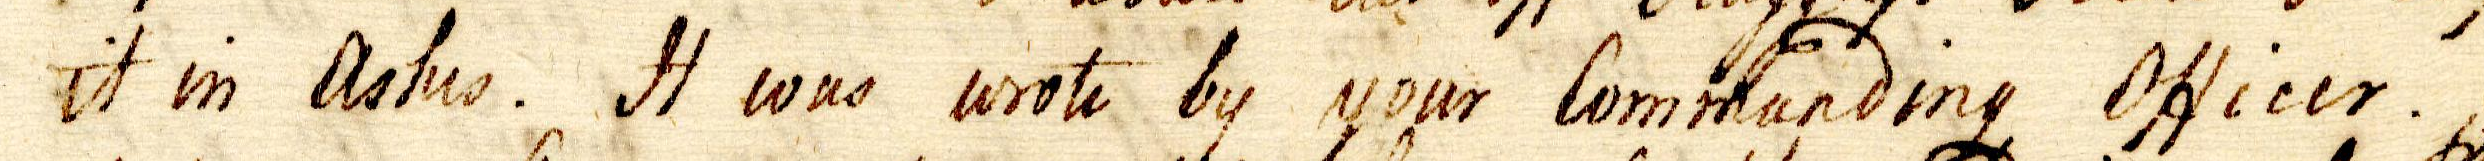it in Ashes. It was wrote by your Commanding Officer.
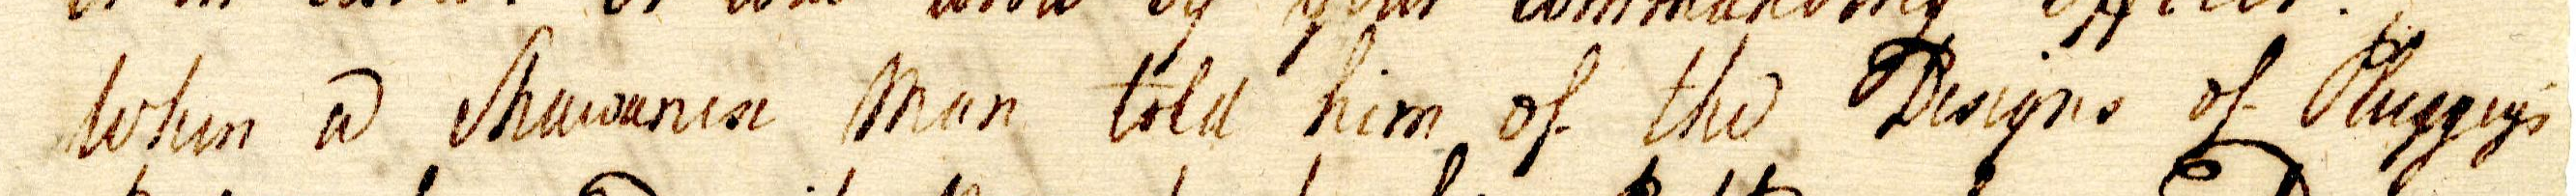When a Shawanese Man told him of the Designs of Pluggeys
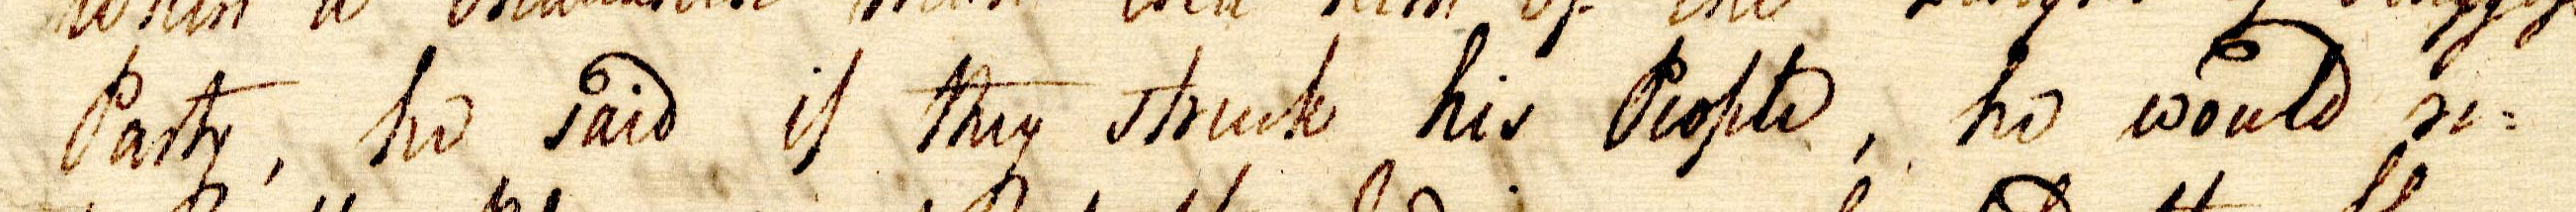Party, he said if they struck his People, he would re-
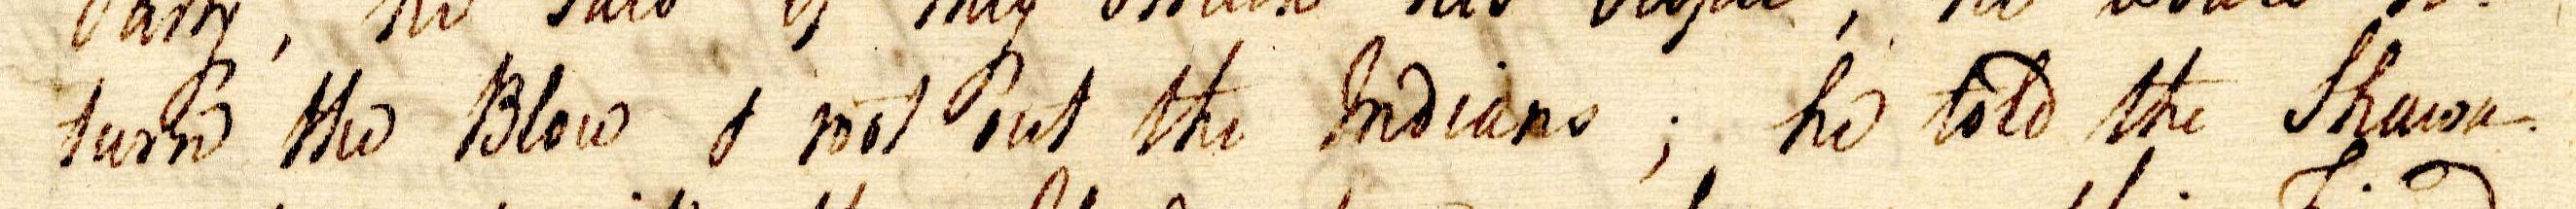turn the Blow & root out the Indians; he told the Shawa-
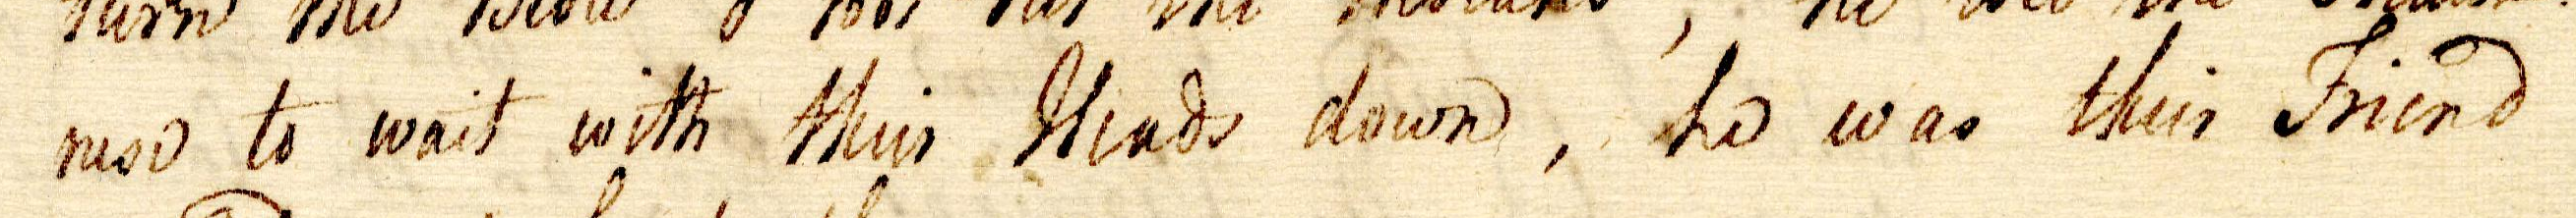nese to wait with their Heads down, he was their Friend
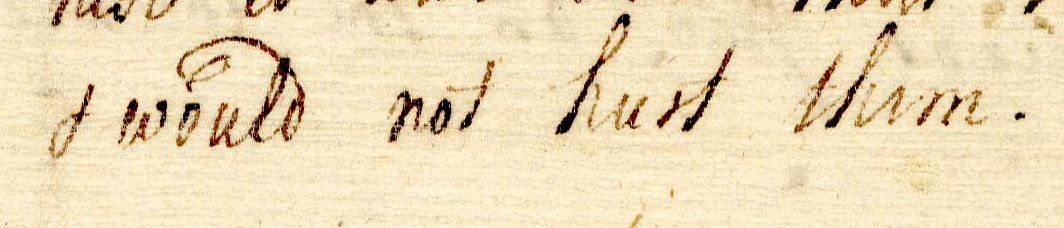& would not hurt them.
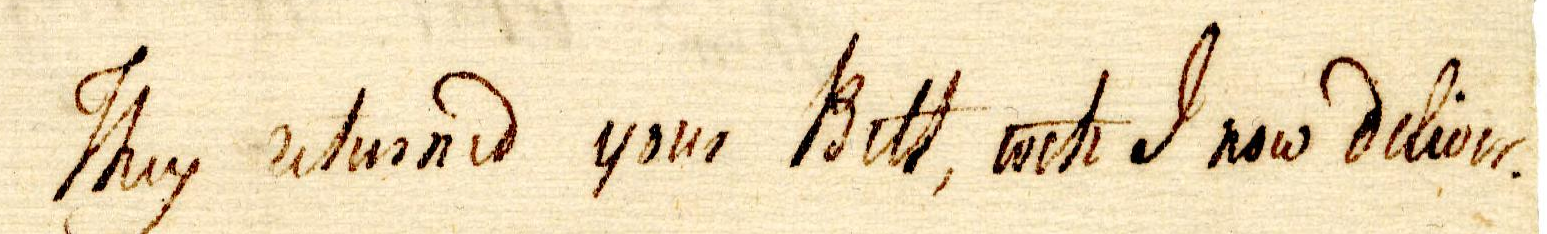They returned your Belt, wch I now deliver.
